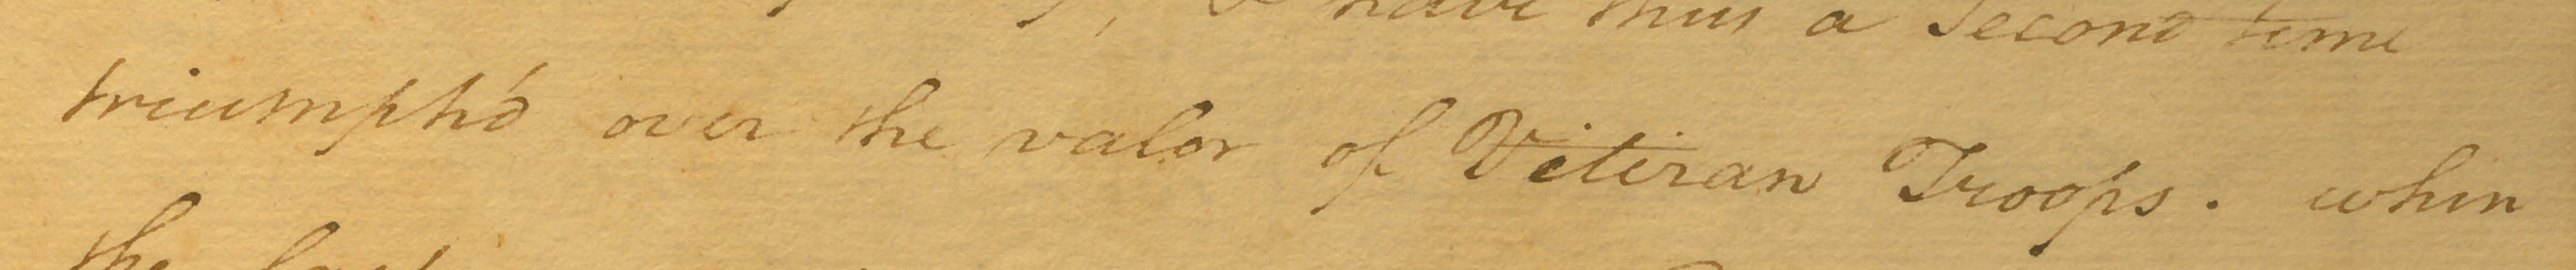triumph'd over the valor of Vitiran Troops. when
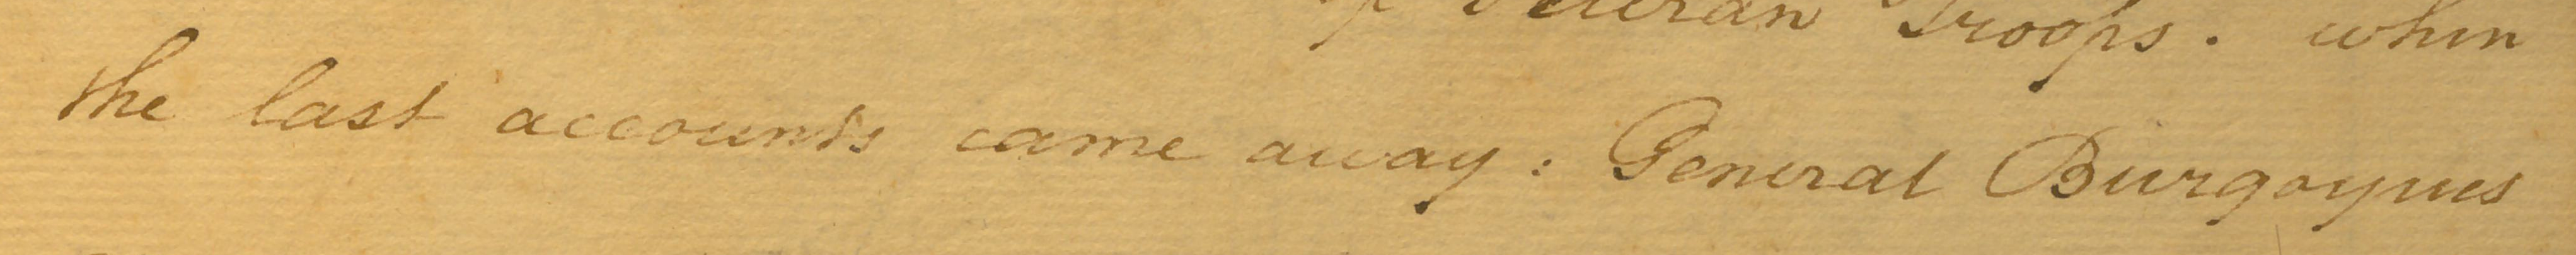the last accounts came away: General Burgoynes
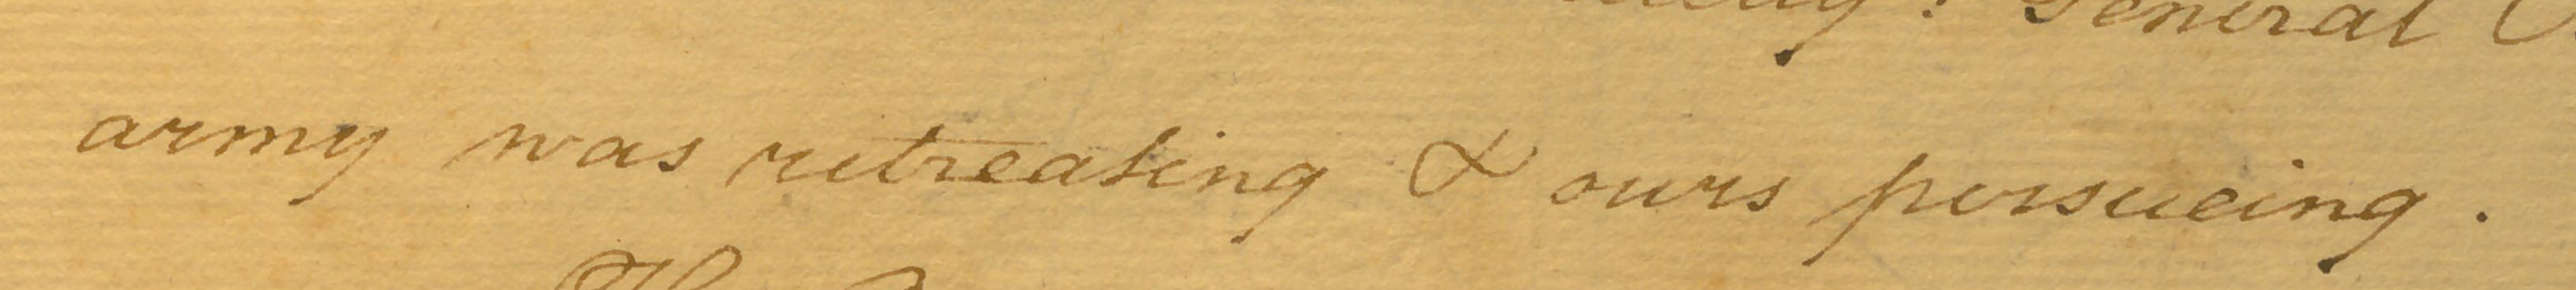army was retreating & ours pursueing.
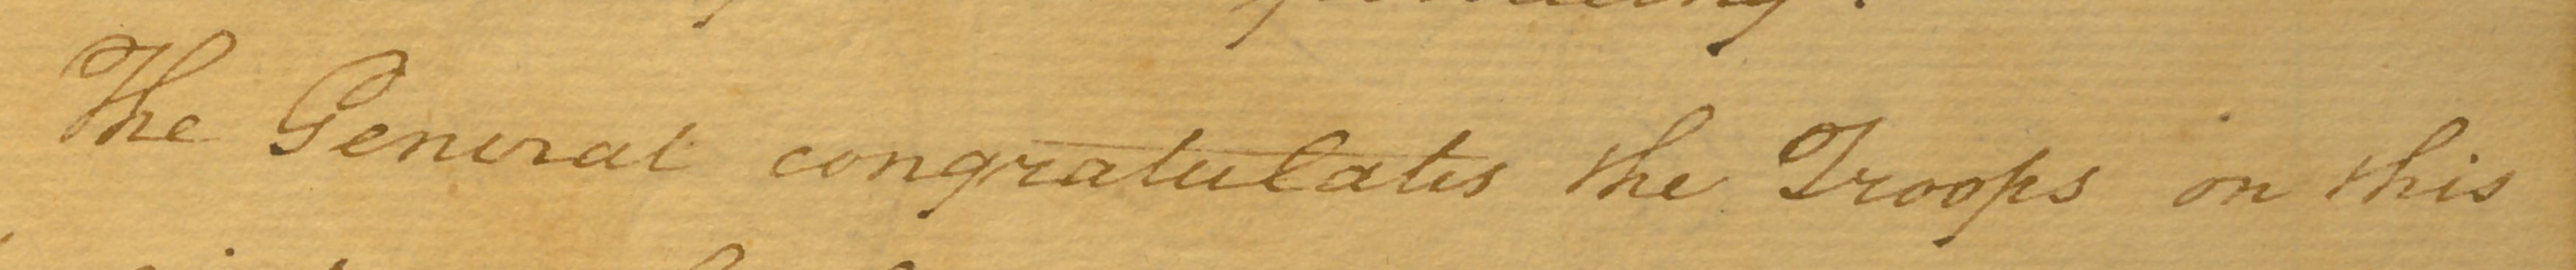The General congratulates the Troops on this
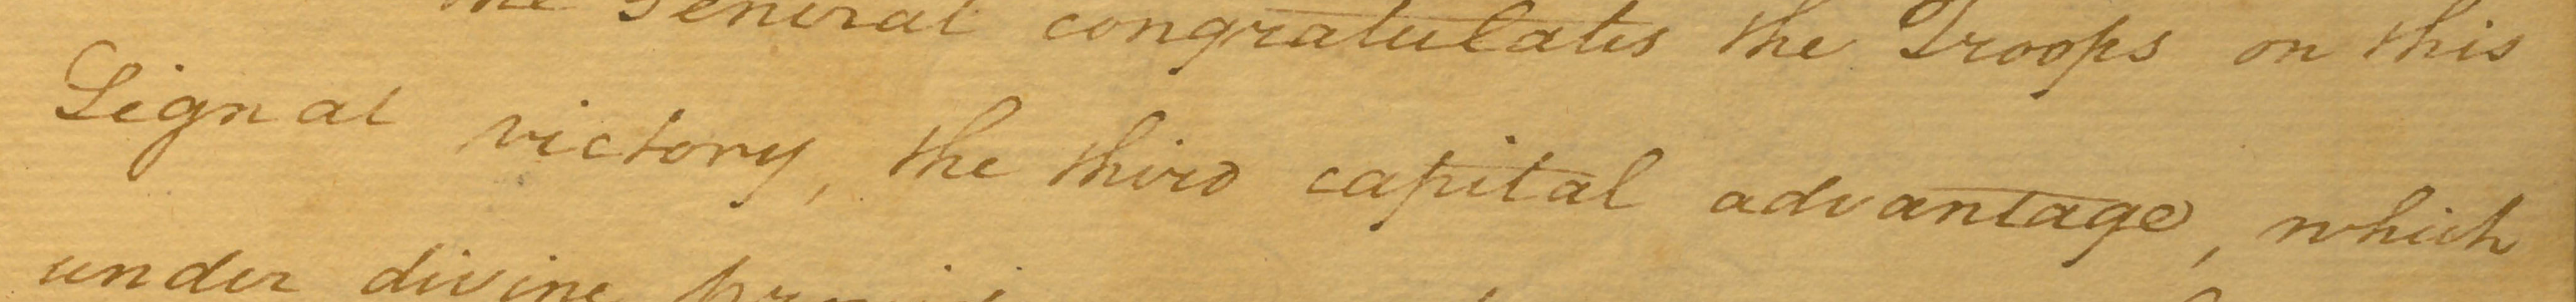Signal victory, the third capital advantage, which
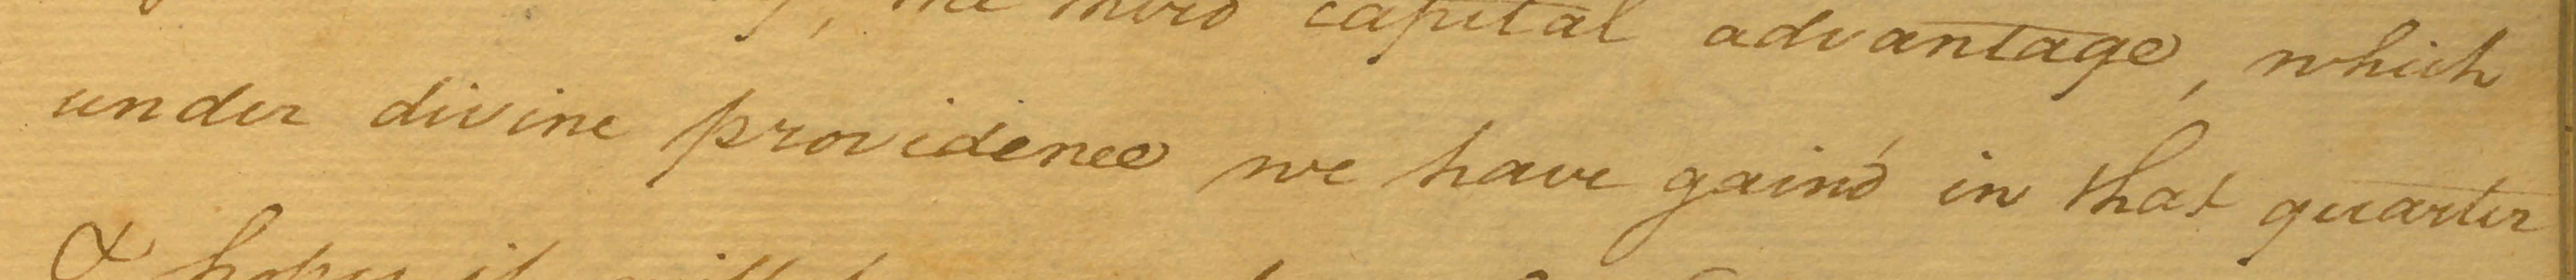under divine providence we have gain'd in that quarter
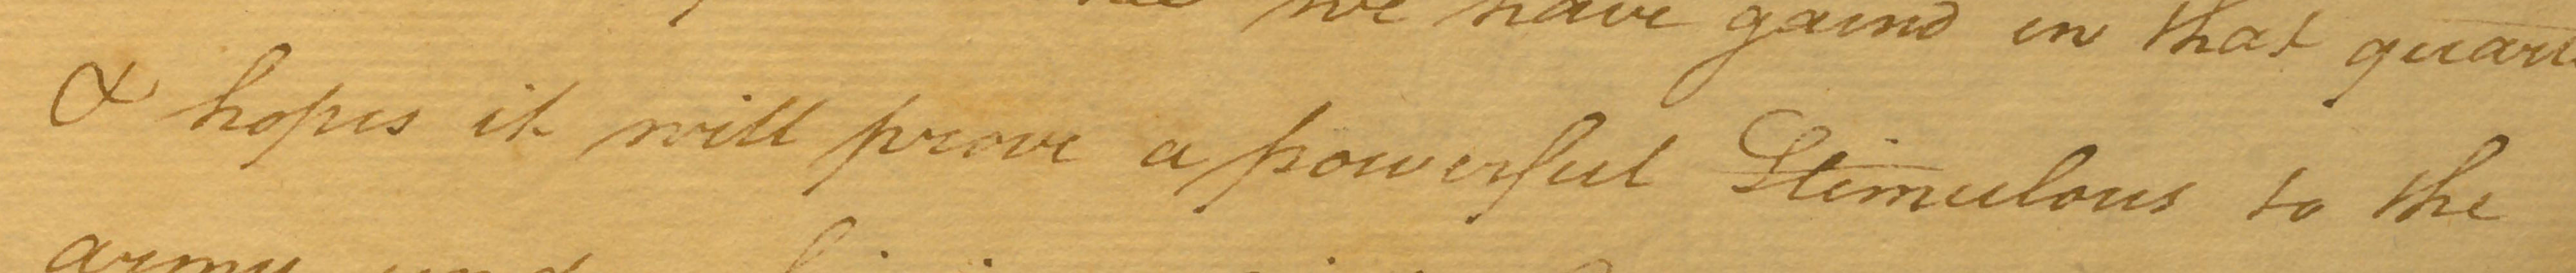& hopes it will prove a powerful Stimulous to the
